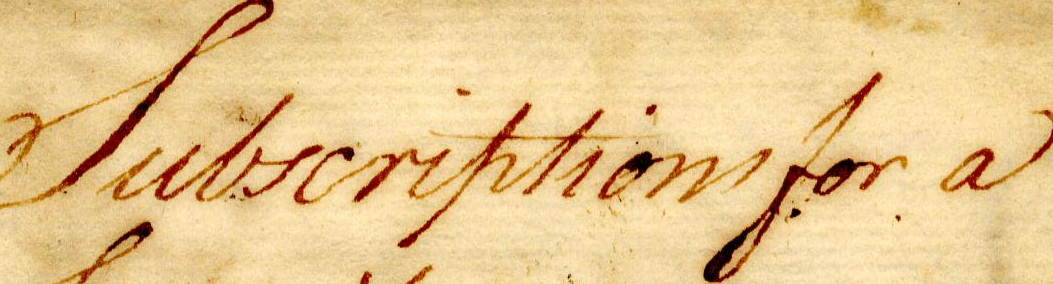Subscription for a
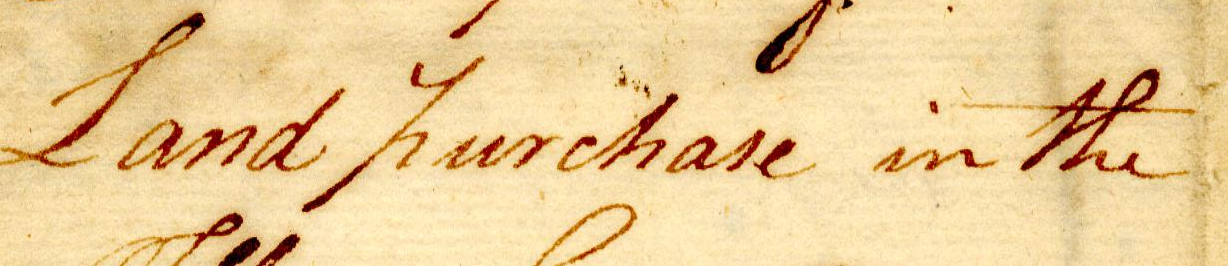Land purchase in the
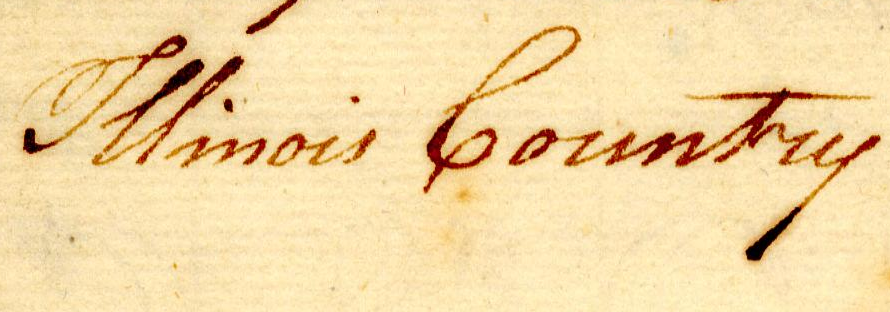Illinois Country
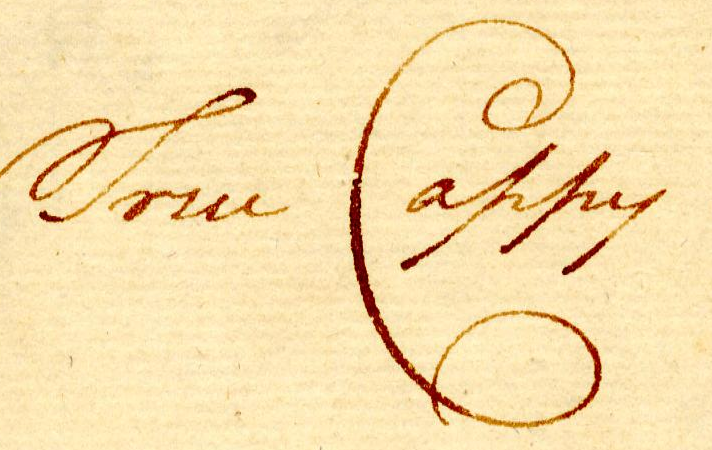True Coppy
